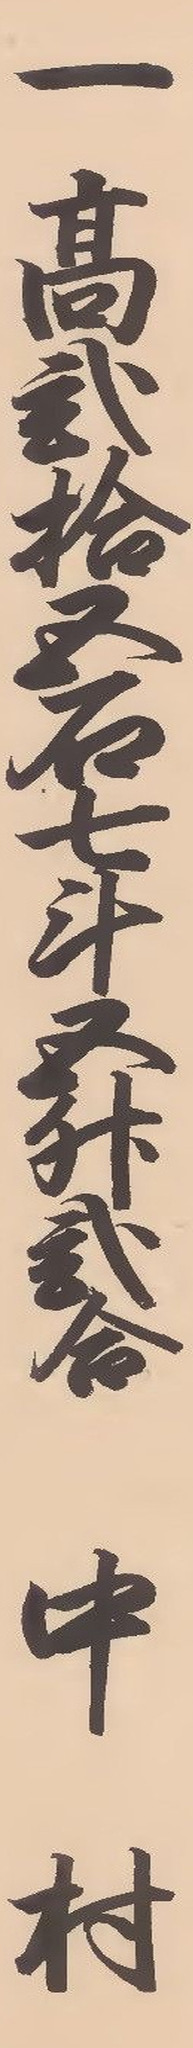一高弐拾五石七斗五升弐合中村
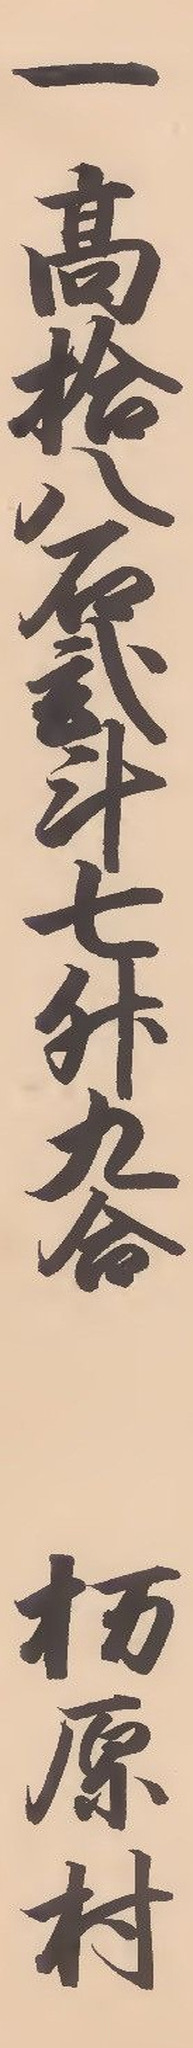一高拾八石弐斗七升九合栃原村

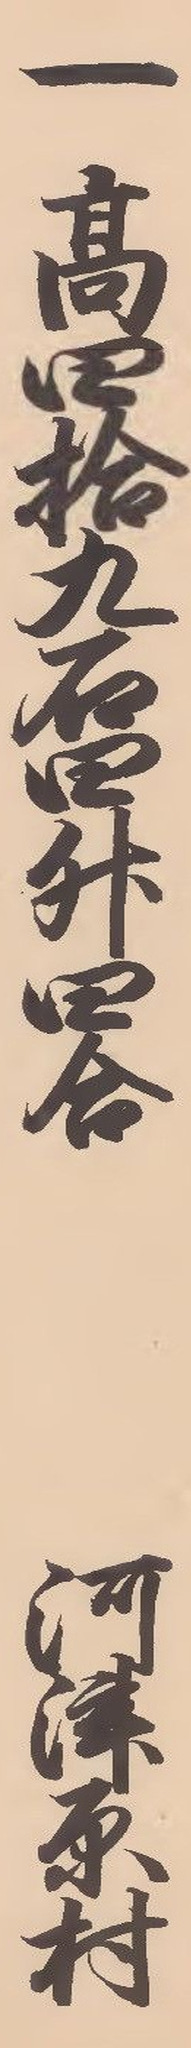一高四拾九石四升四合河津原村
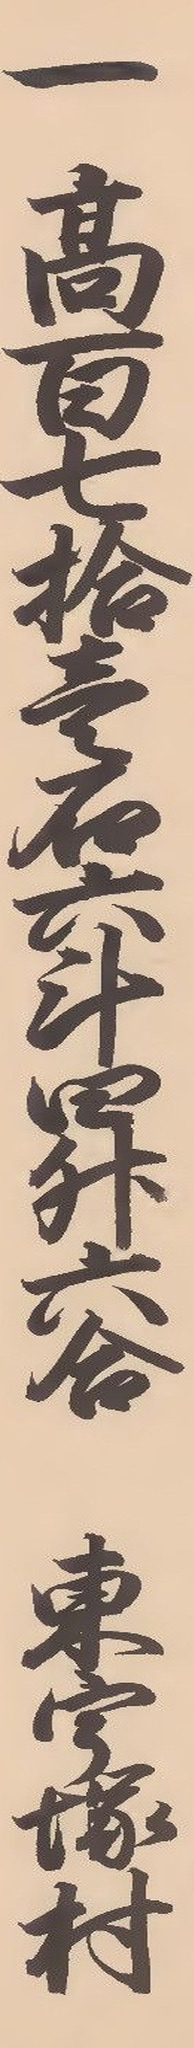一高百七拾壱石六斗四升六合東宇塚村
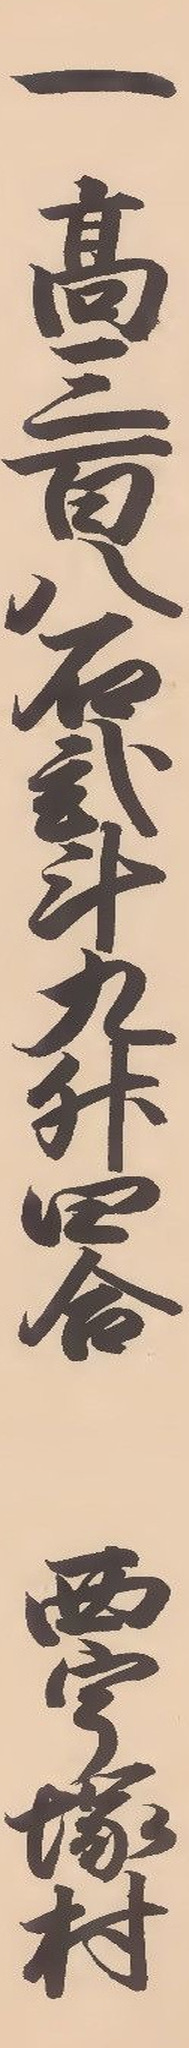一高三百八石弐斗九升四合西宇塚村
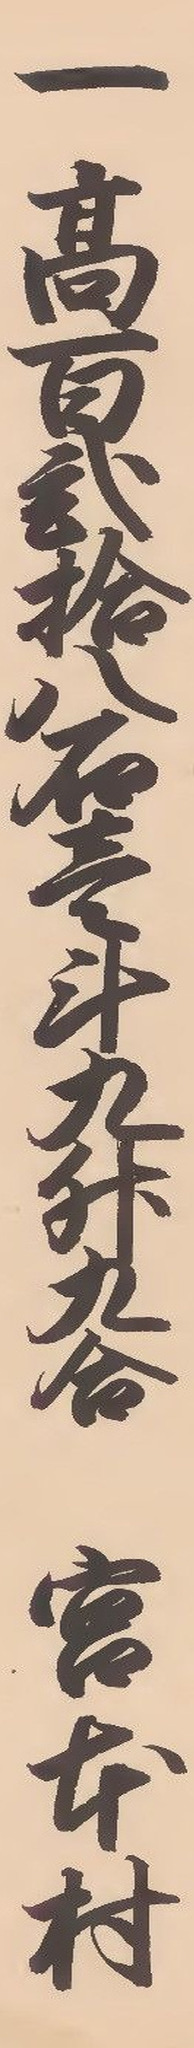一高百弐拾八石壱斗九升九合宮本村
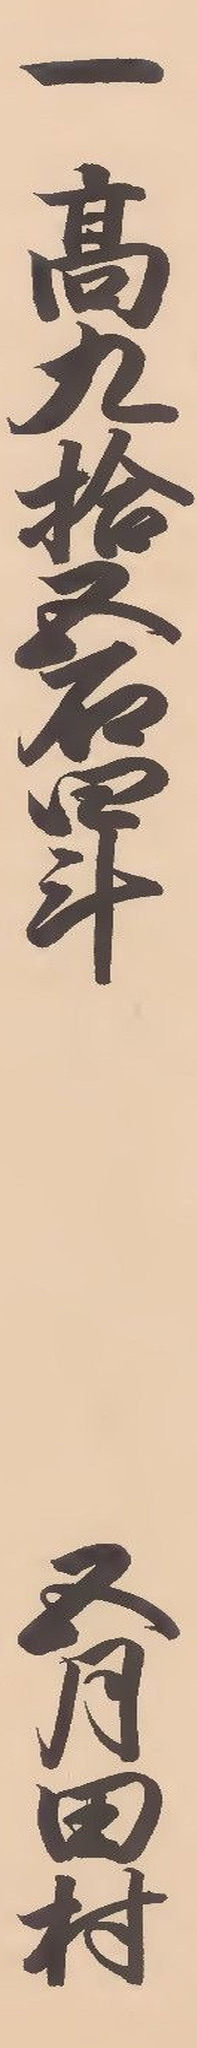一高九拾五石四斗五月田村
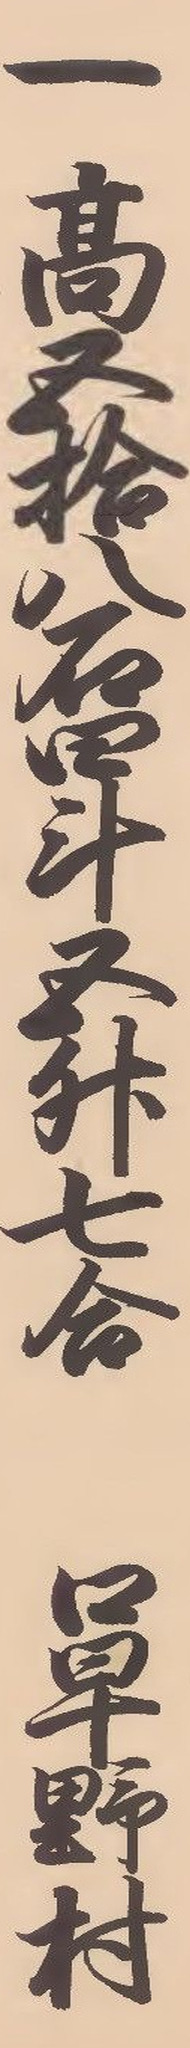一高五拾八石四斗五升七合口早野村
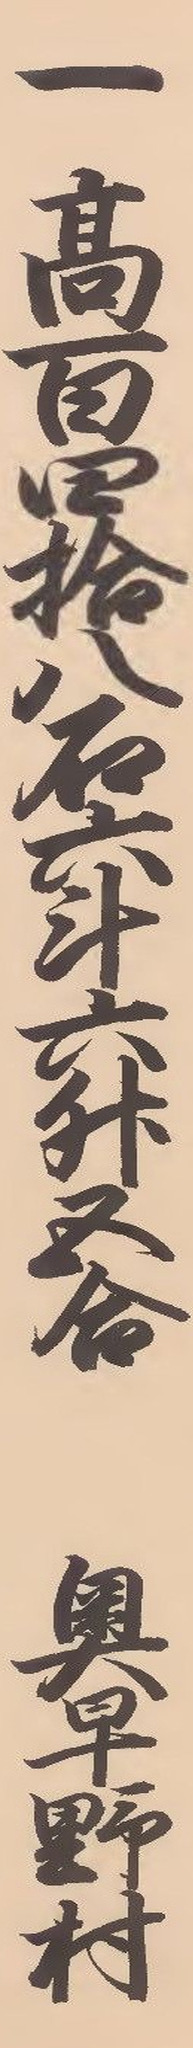一高百四拾八石六斗六升五合奥早野村
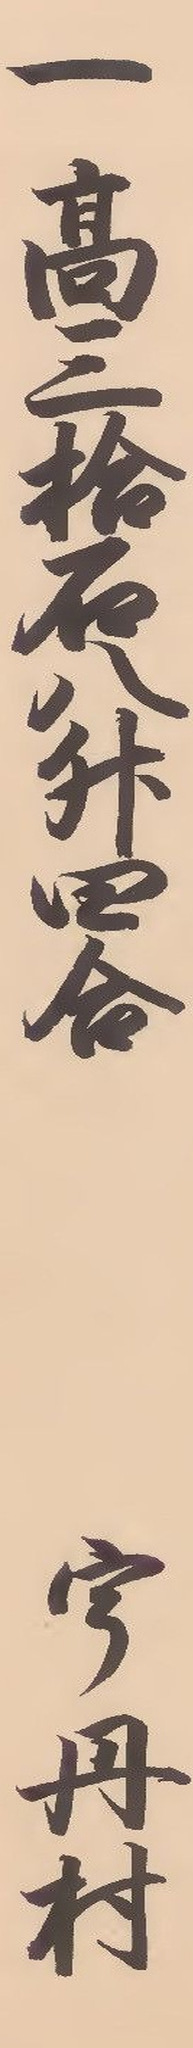一高三拾石八升四合宇丹村

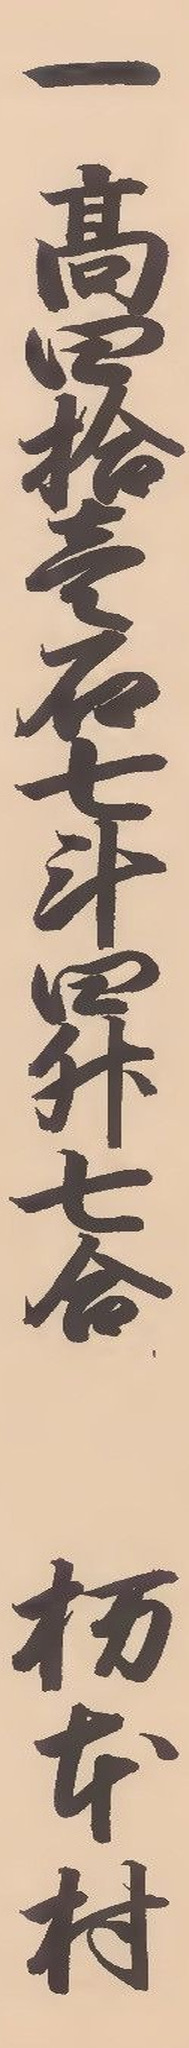一高四拾壱石七斗四升七合栃本村
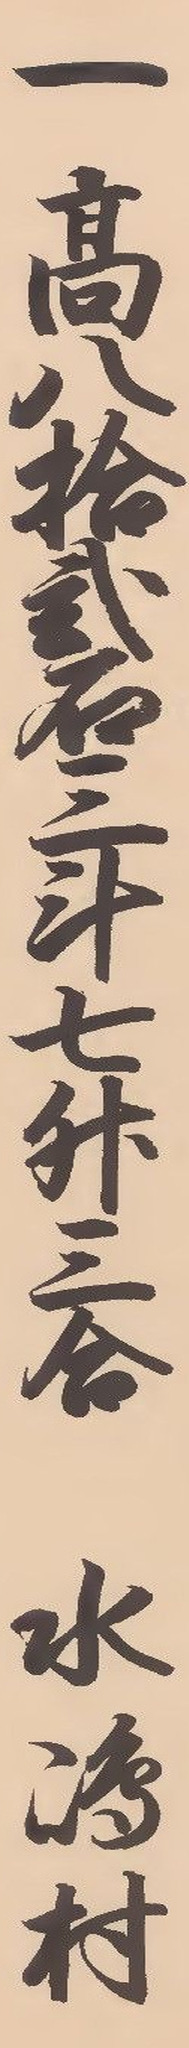一高八拾弐石三斗七升三合水島村
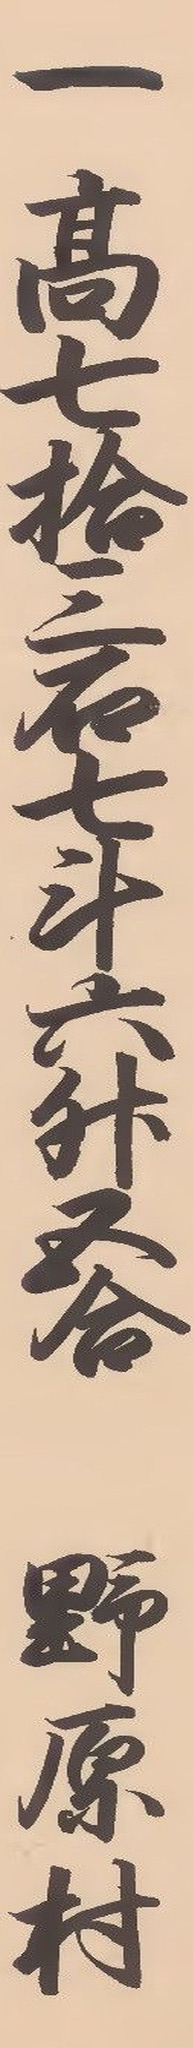一高七拾三石七斗六升五合野原村
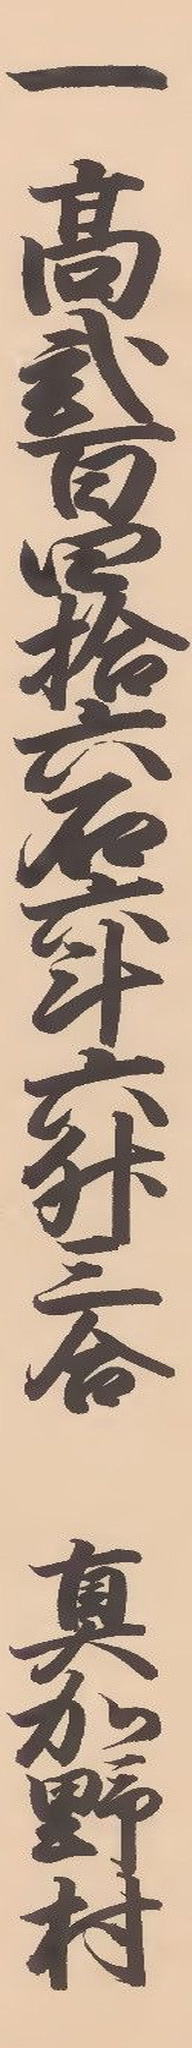一高弐百四拾六石六斗六升三合真加野村
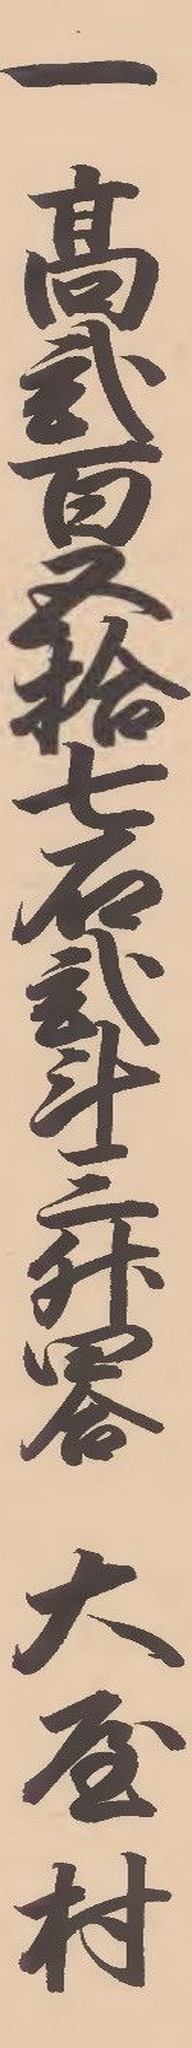一高弐百五拾七石弐斗三升四合大屋村
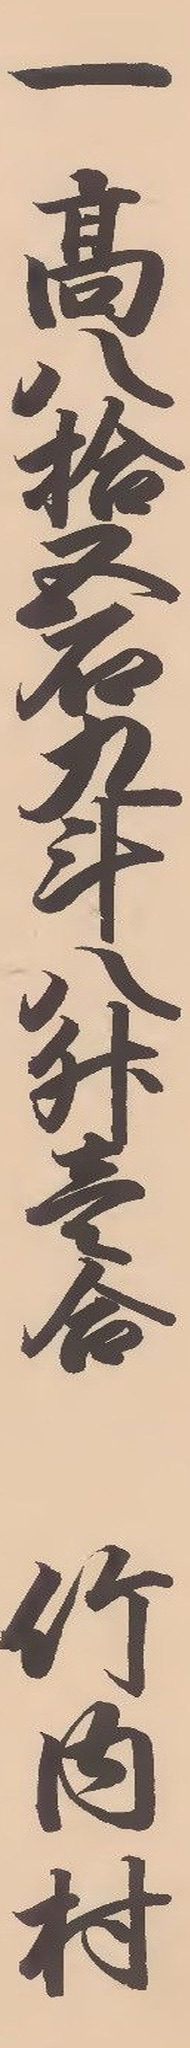一高八拾五石九斗八升壱合竹内村
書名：因幡国郷帳
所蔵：国立公文書館 National Archives of Japan
